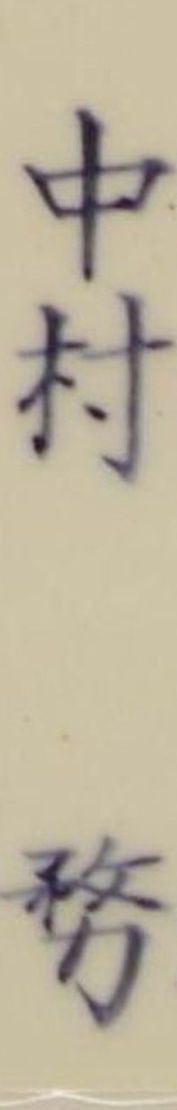中村務
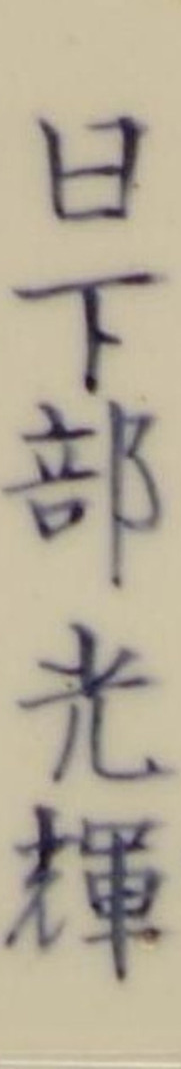日下部光輝
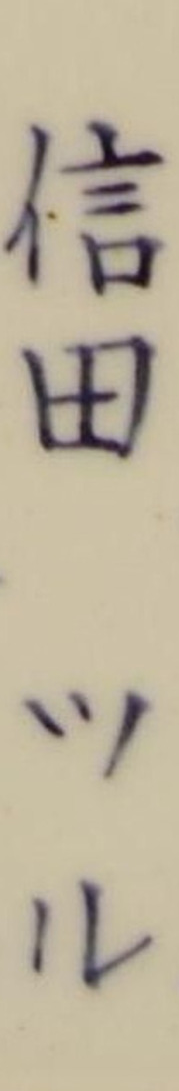信田ツル
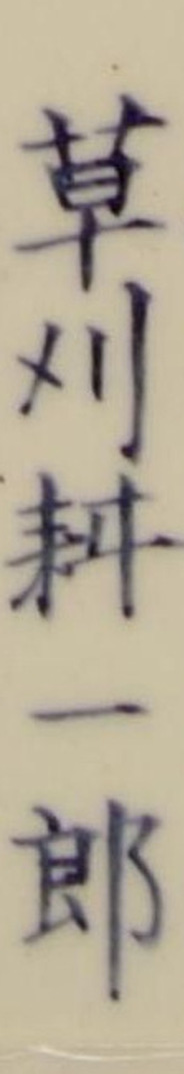草刈耕一郎
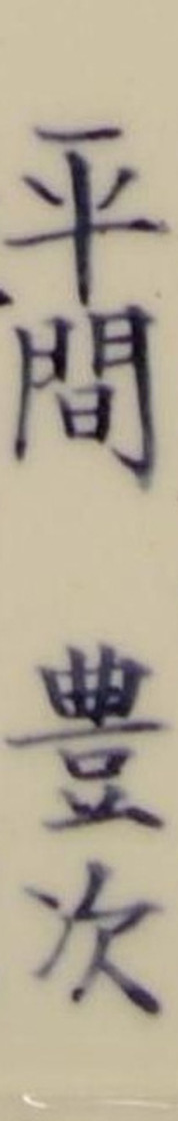平間豊次
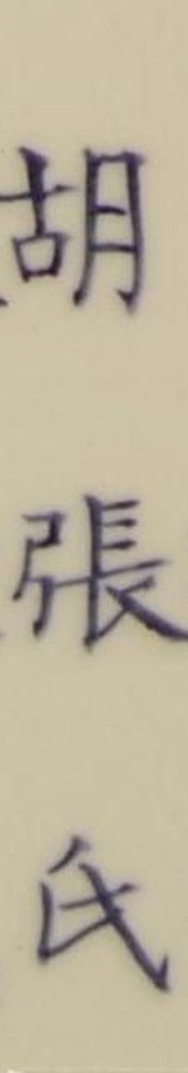胡張氏
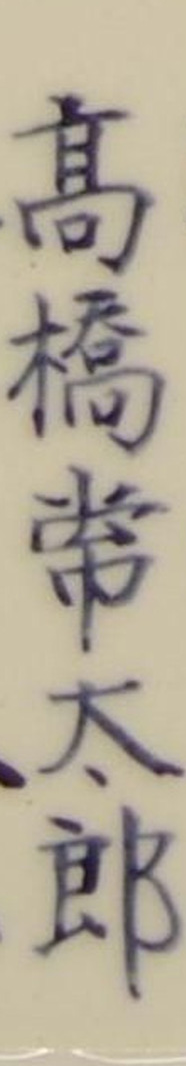高橋常太郎
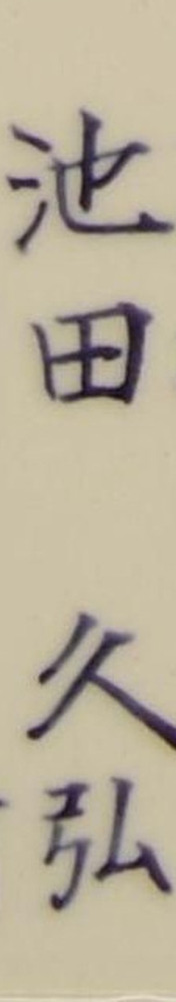池田久弘
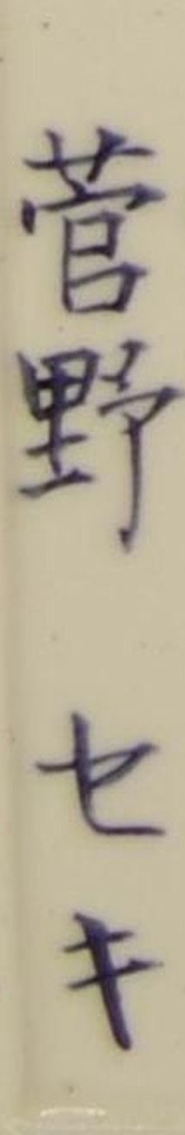菅野セキ

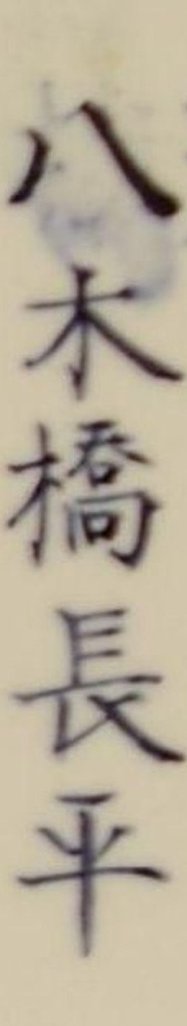八木橋長平
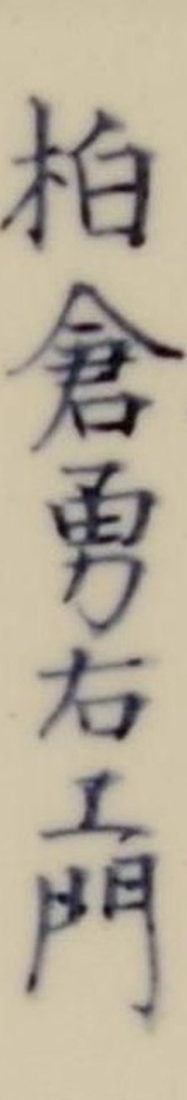柏倉勇右エ門
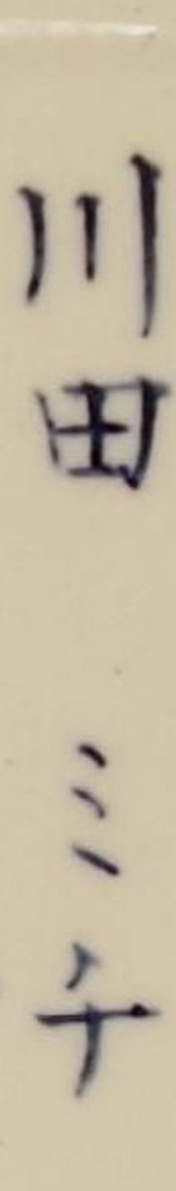川田ミチ
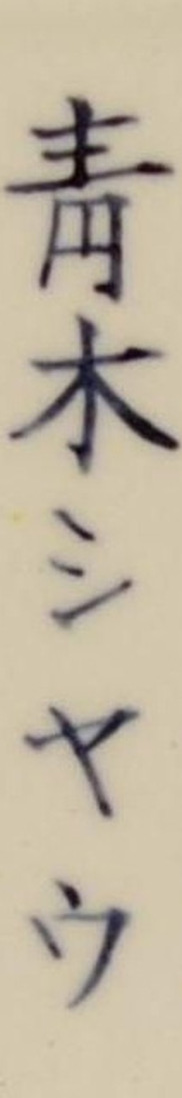青木シヤウ
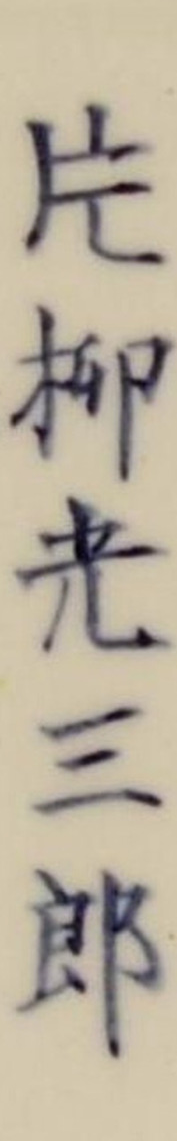片柳光三郎
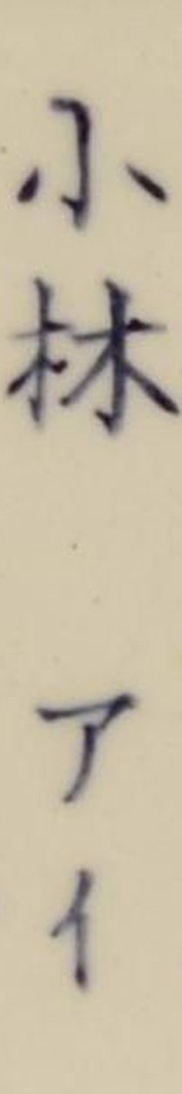小林アイ
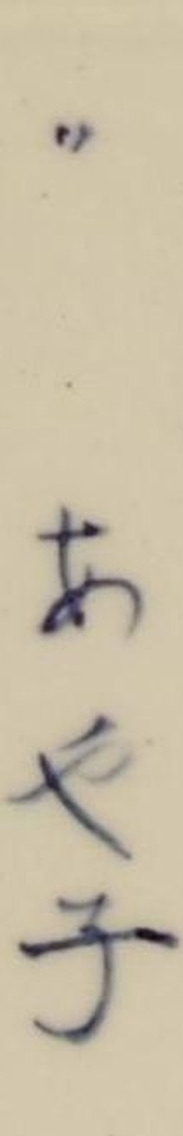あや子
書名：E~L
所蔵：高野山金剛峯寺
